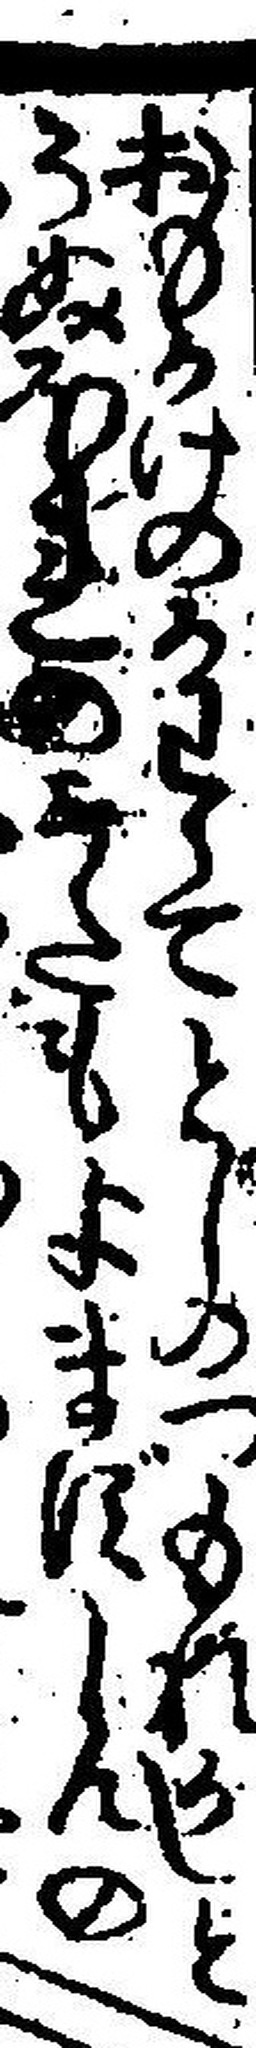うぬほれのうたもよまずしんの
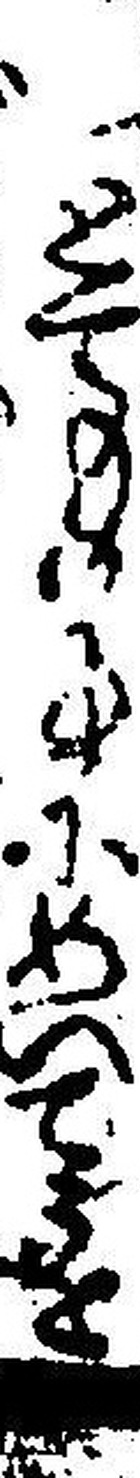〽とてもの事にめいてうを
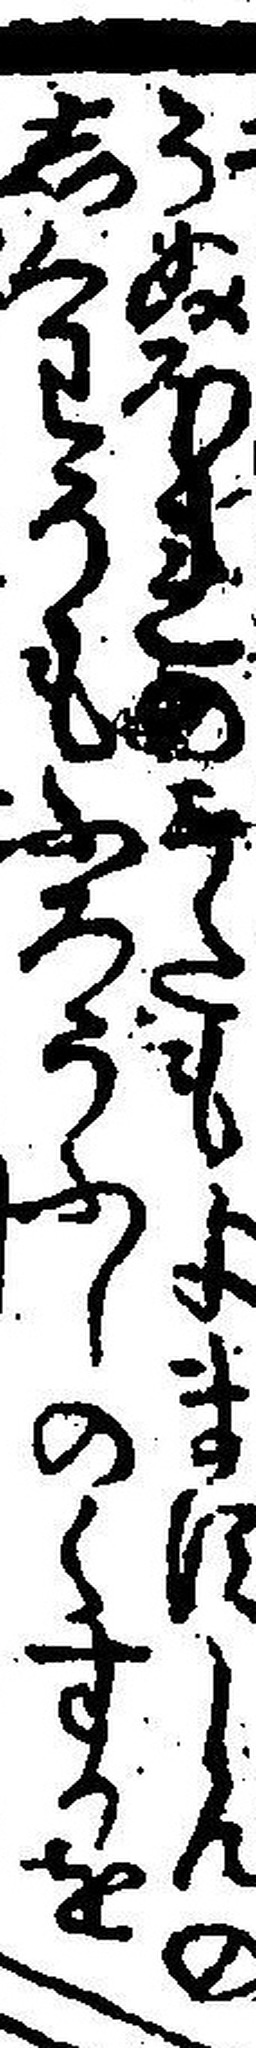しくわうもふろうふしのくすりを
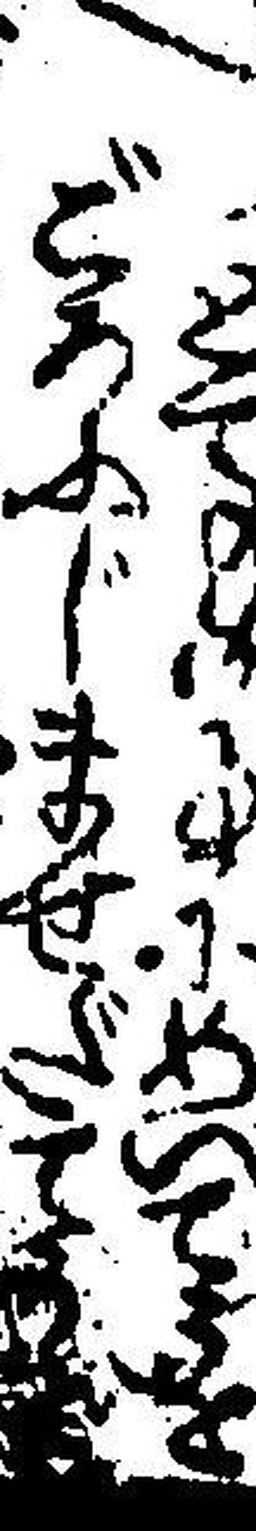ごろふじませだてうを
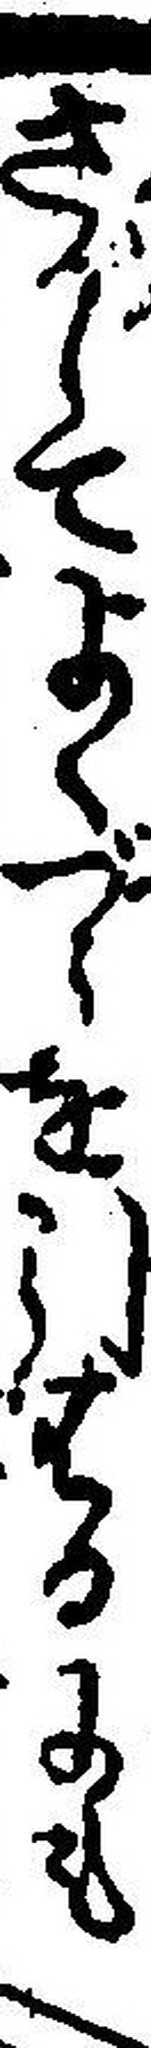さかしてよくづらを引はるにも
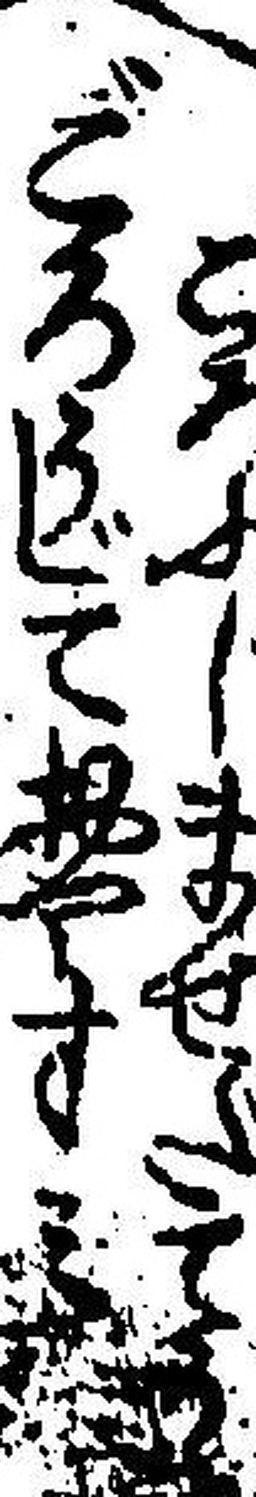ごろうじておやすみ
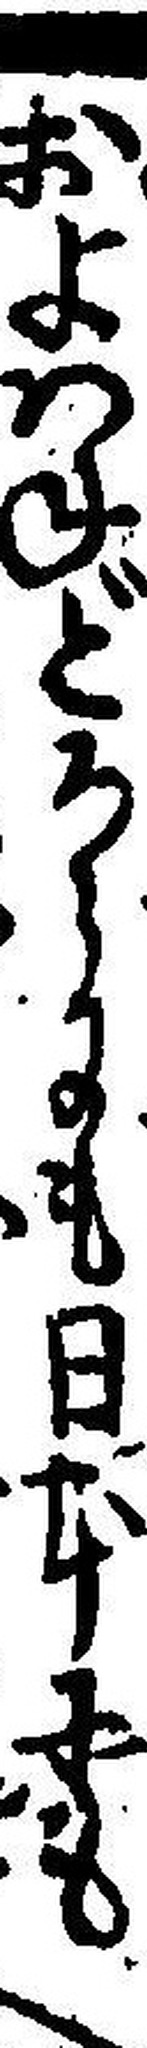およはねどからにも日本にも
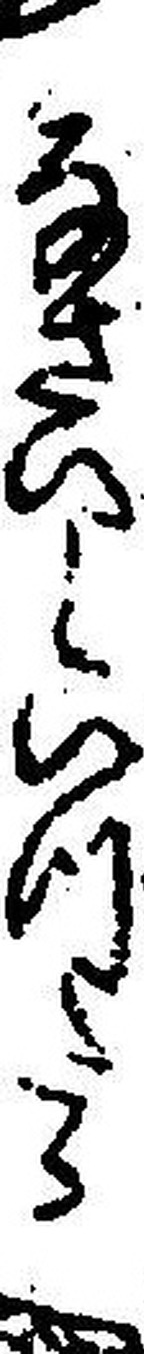なさいといつたら
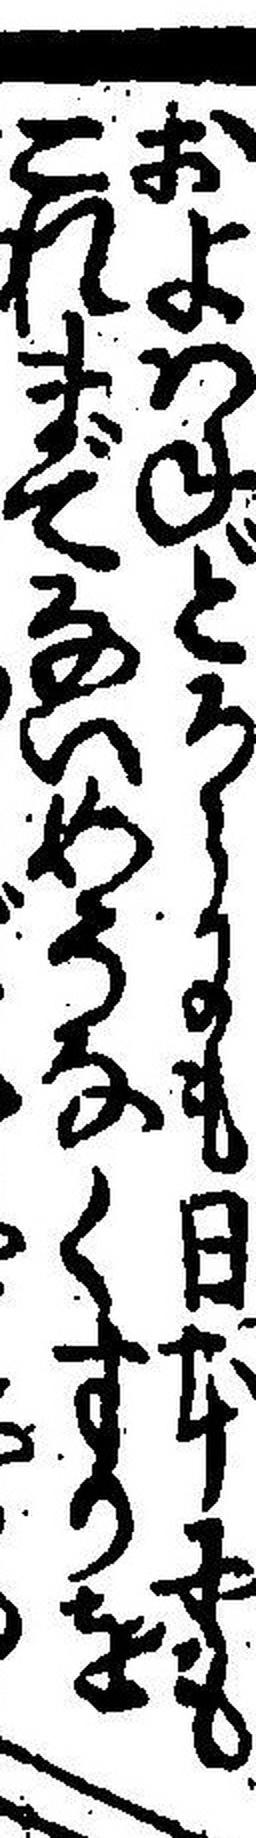これまでないめうなくすりを
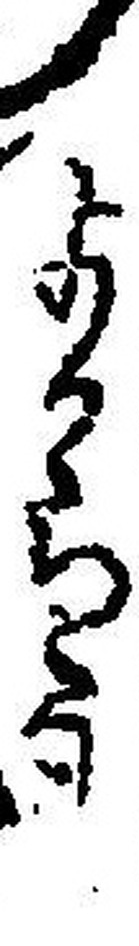よからう
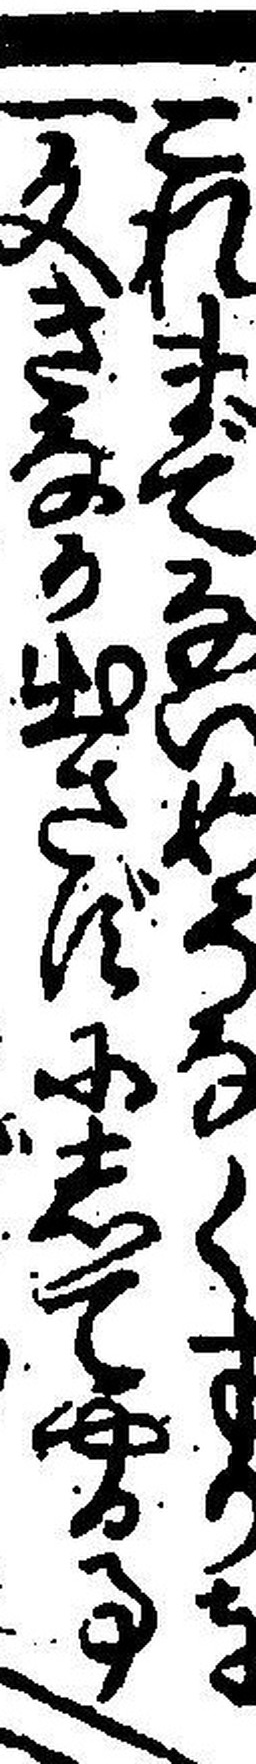一文きなか出さずにしてやる事
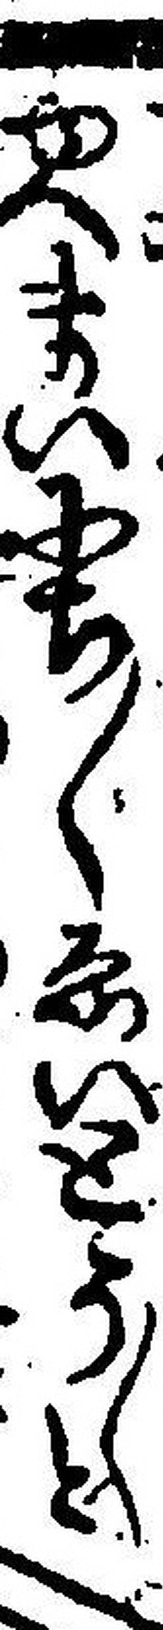ゆへまいにち〳〵ゑいとう〳〵と
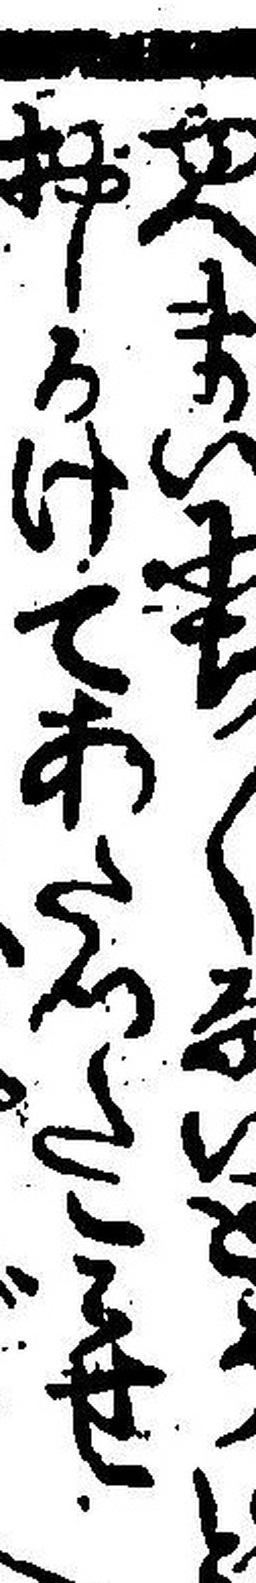おしかけてあたつたみせ
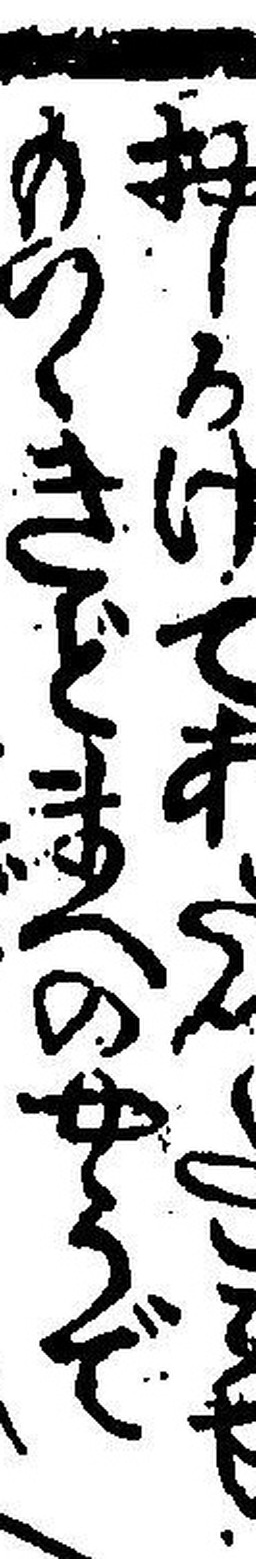ものゝきどまへのやうで
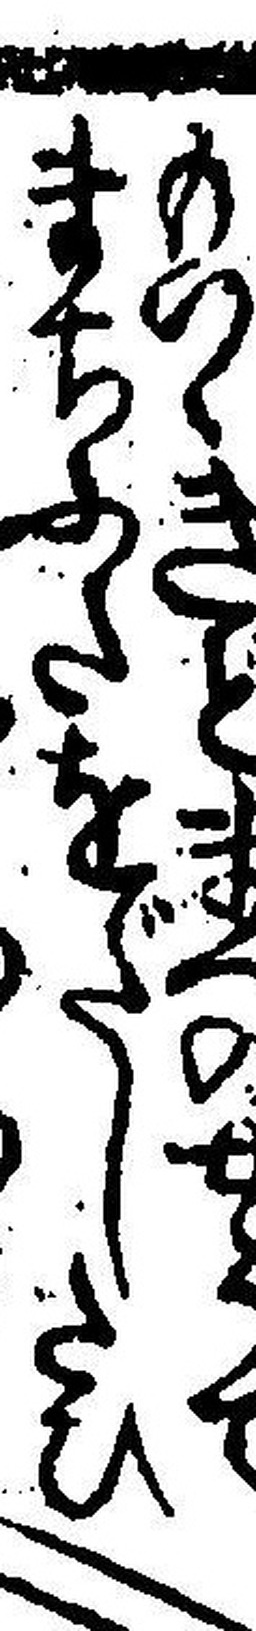まちふたをだしたひ
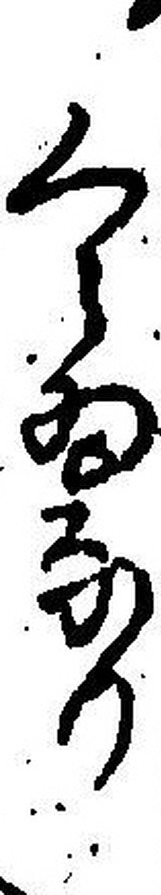くらゐなり
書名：徳若水縁起金性 / 樹下石上作
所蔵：東京大学総合図書館 General Library in the University of Tokyo, JAPAN
